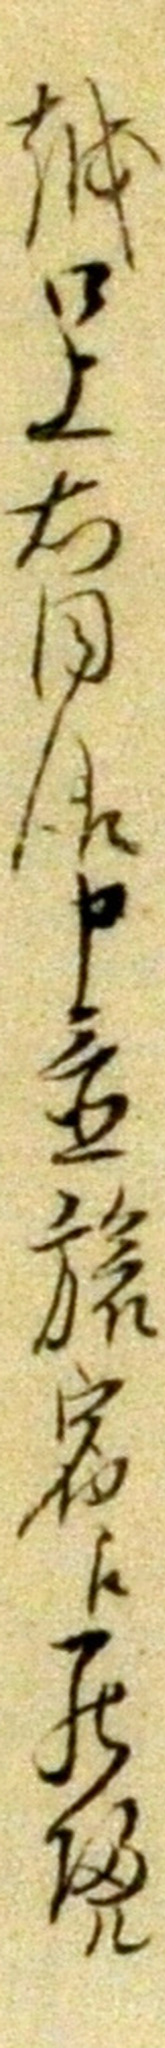越口上右同様申置旅宿え罷帰ル

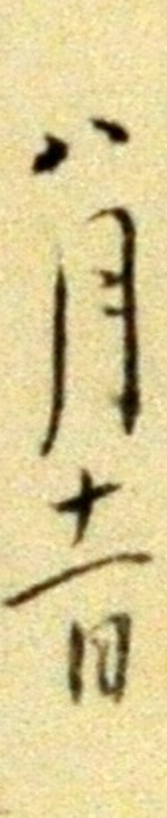八月十一日
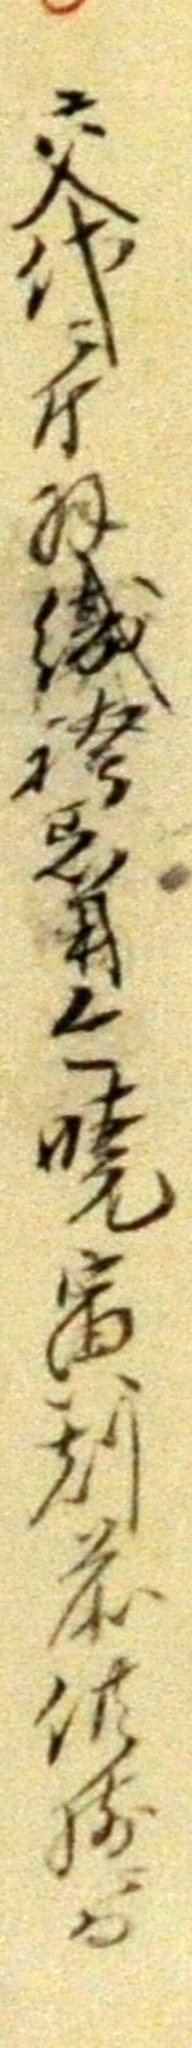交代ニ付羽織袴着用今暁寅刻前供揃ニ而
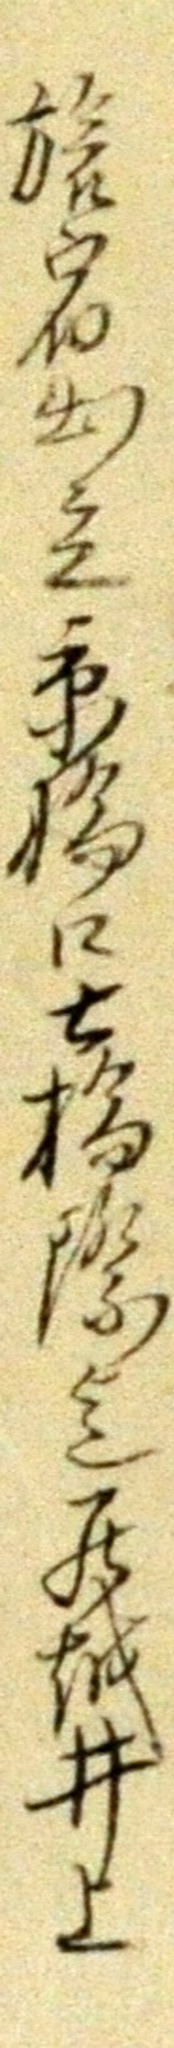旅宿出立京橋口土橋際迄罷越井上
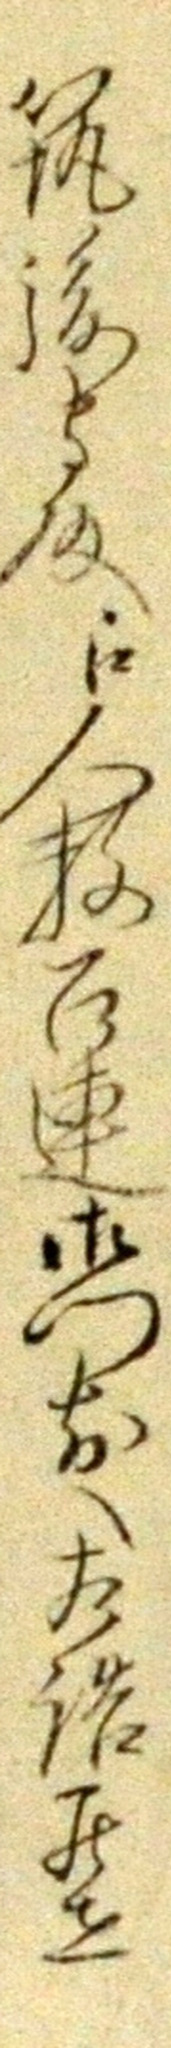筑後守殿え人数召連御門前え相詰罷在
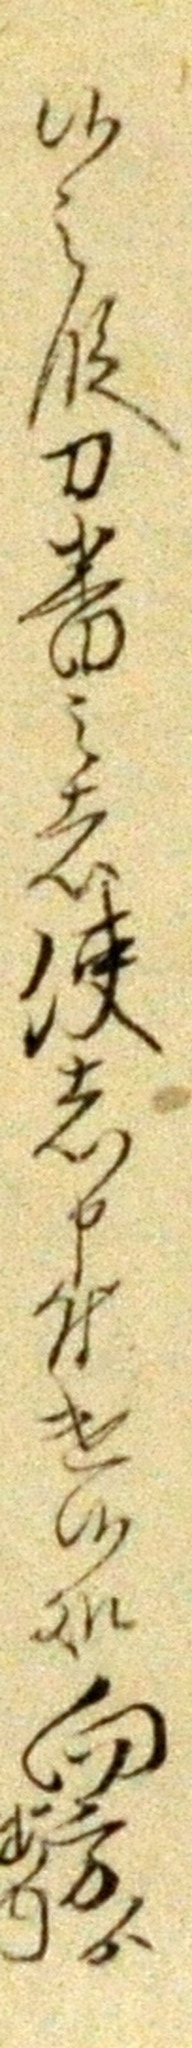候之段刀番之者使者申付遣候処向方ゟ案内
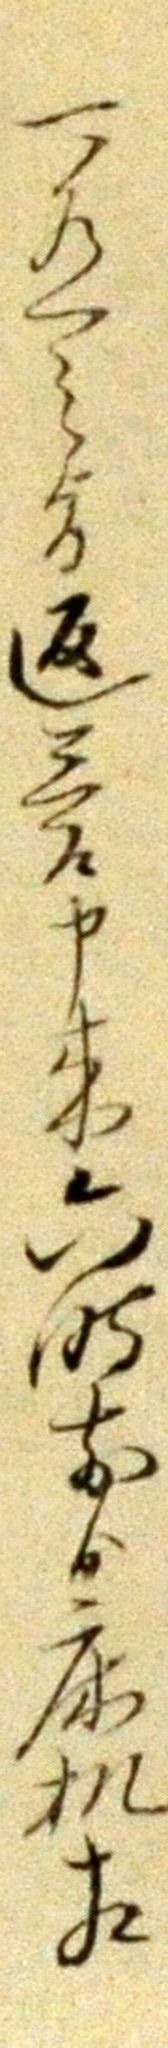可有之旨返答申来六時前ゟ床机相
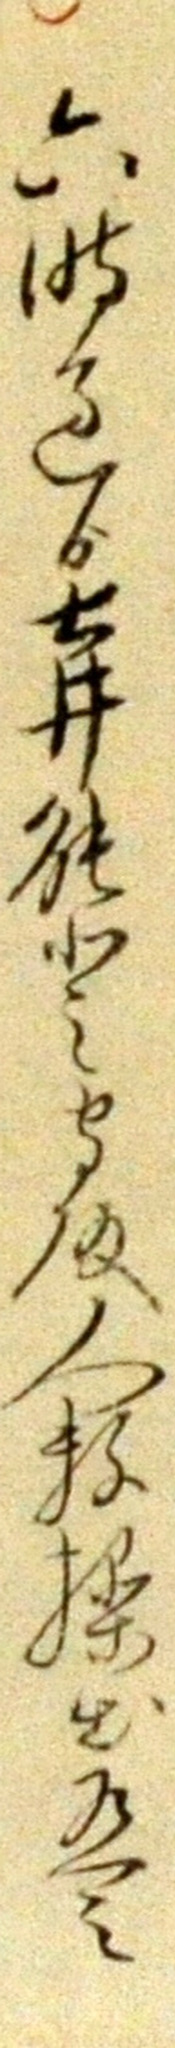六時過ゟ土井能登守殿人数操出有之
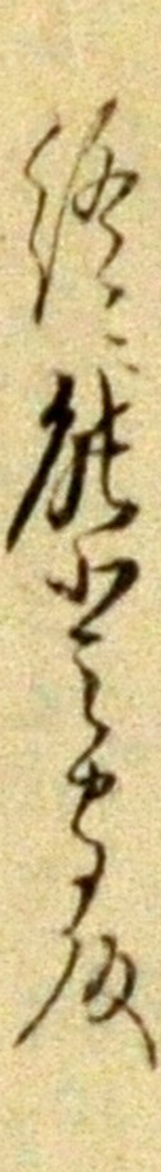終ニ能登守殿
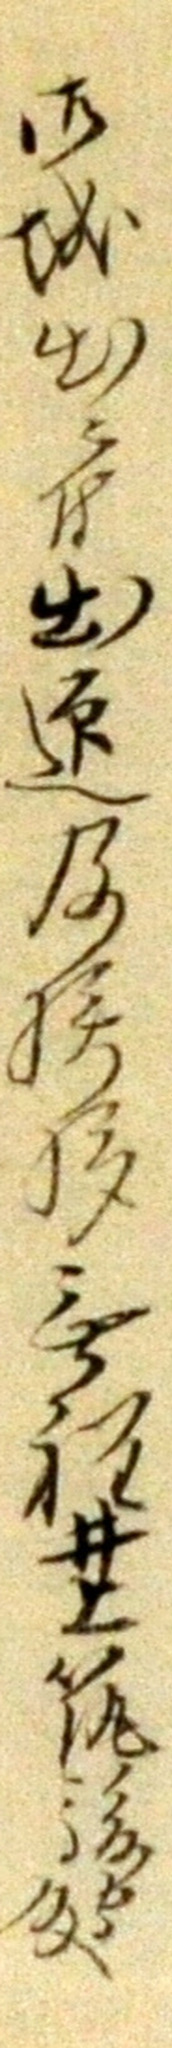御城出二付出迎及挨拶無程井上筑後守殿
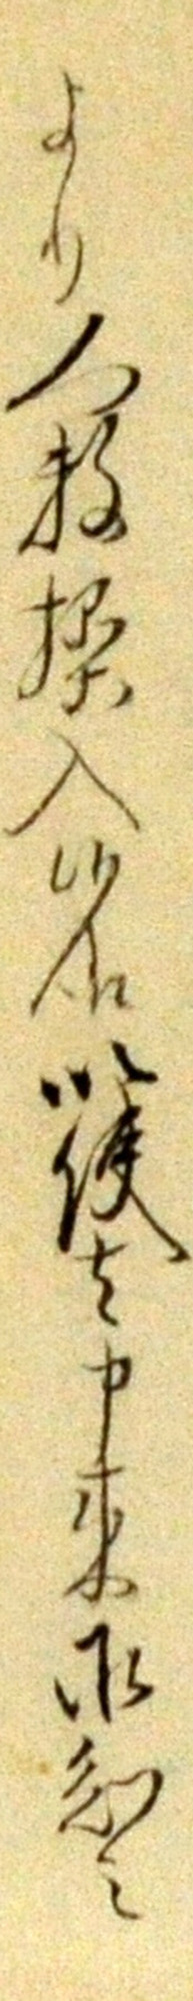より人数繰入候様以使者申来承知之
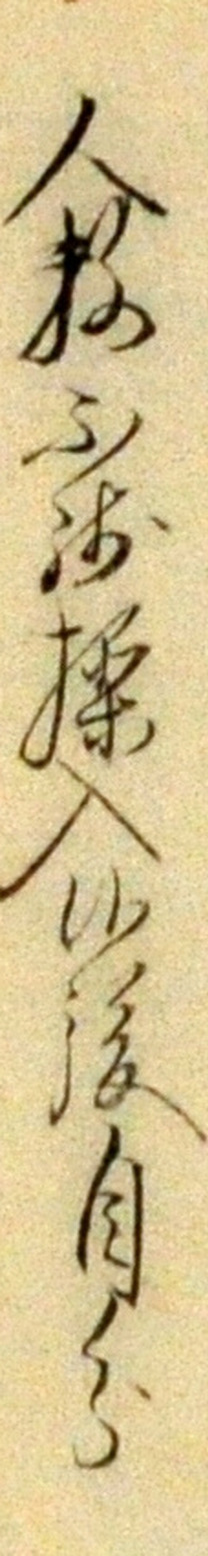人数不残繰入候後自分
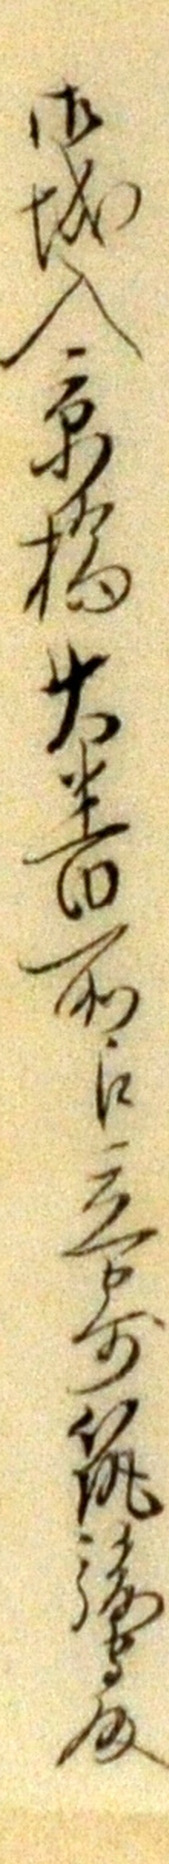御城入京橋大番所え立寄筑後守殿
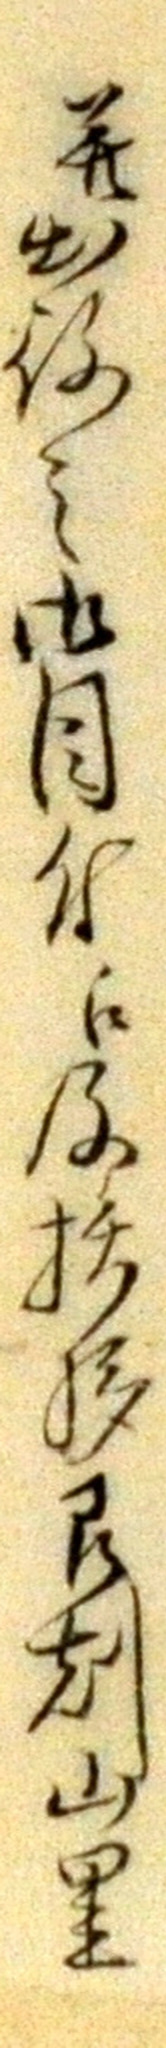并出役之御目付え及挨拶即刻山里
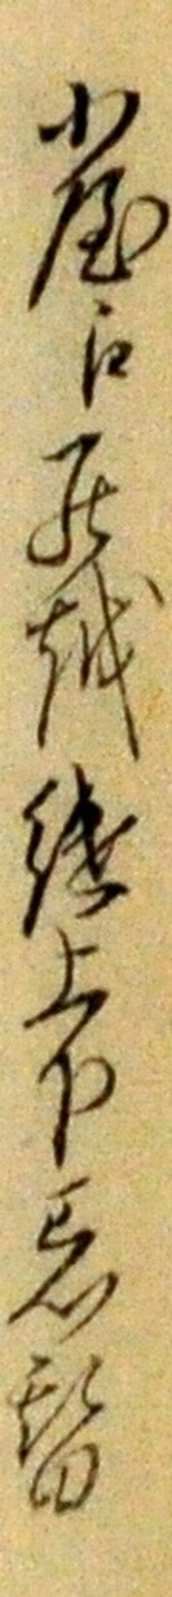小屋え罷越継上下着替
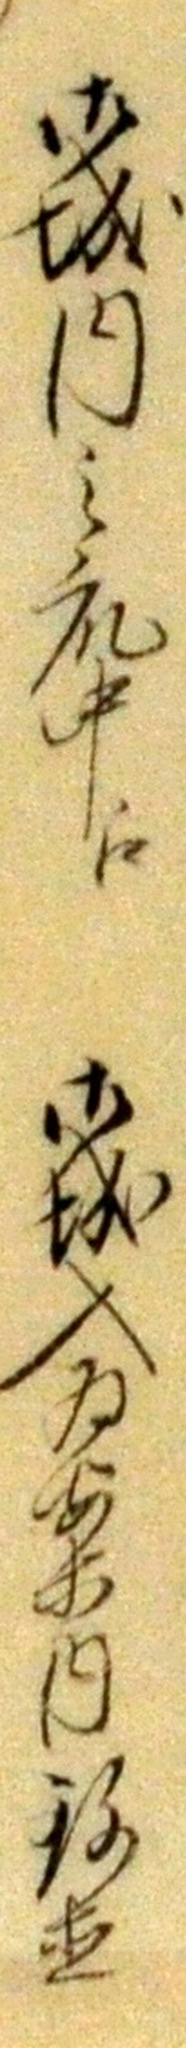御城之衆中え御城入為案内致直
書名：大阪加番関係諸書留〔一括〕
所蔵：伊那市立高遠町図書館・合同会社AMANE
